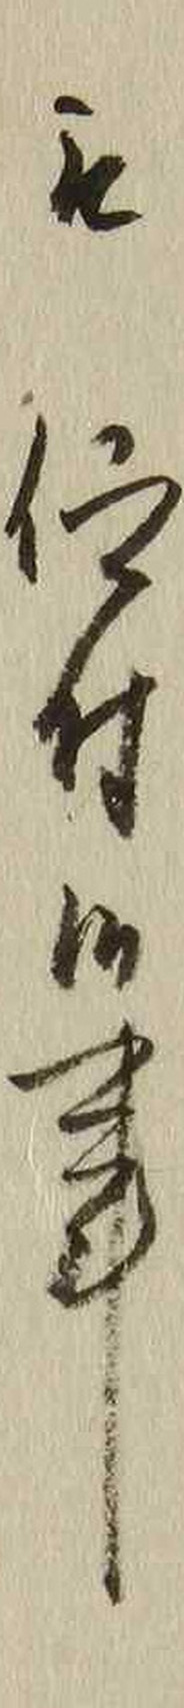被仰付候事
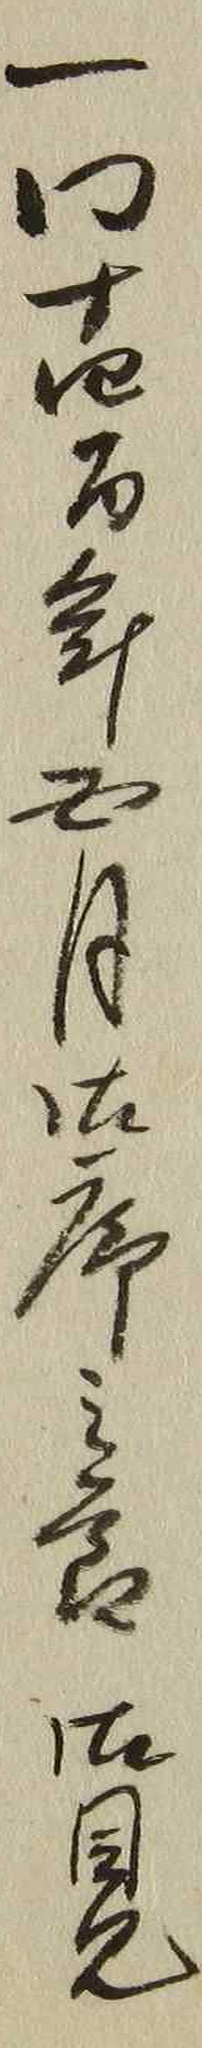一同十四酉年五月御序之節御目見
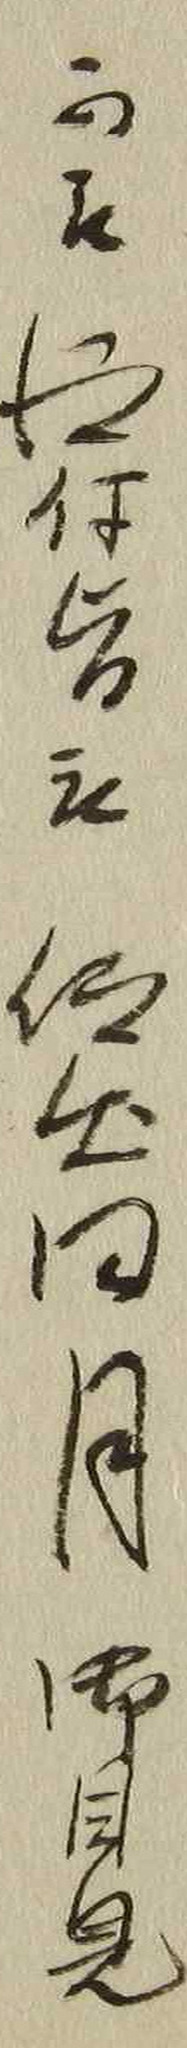可被仰付旨被仰出同月御目見
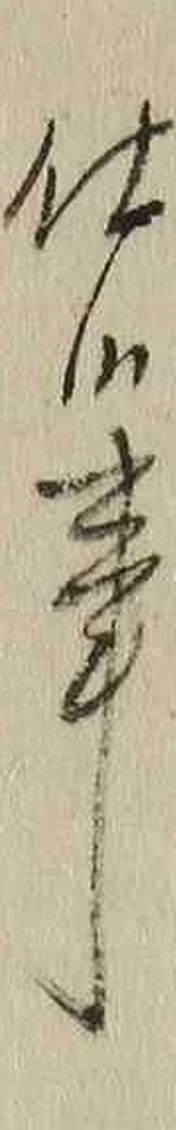仕候事
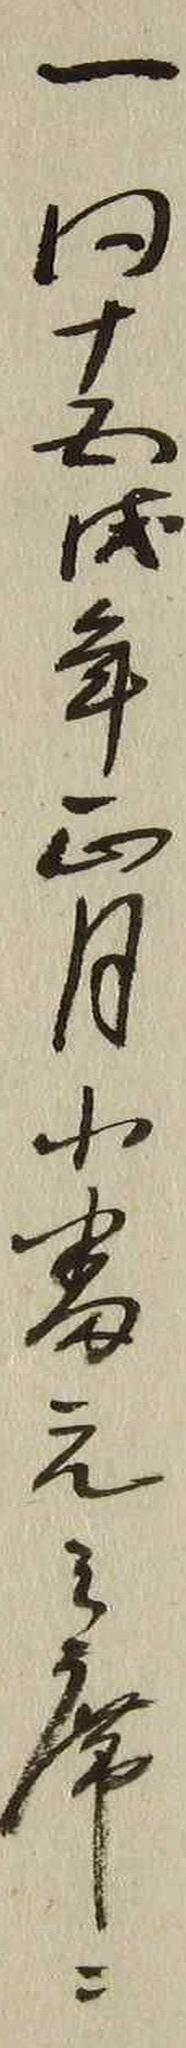一同十五戌年正月小番元之席ニ
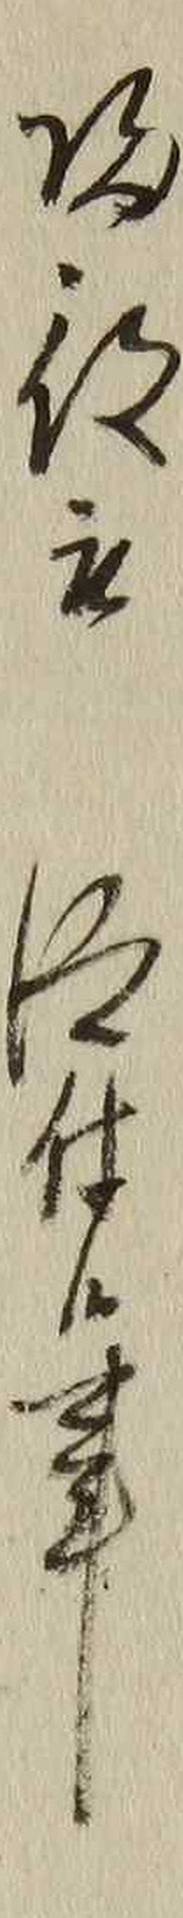帰役被仰付候事
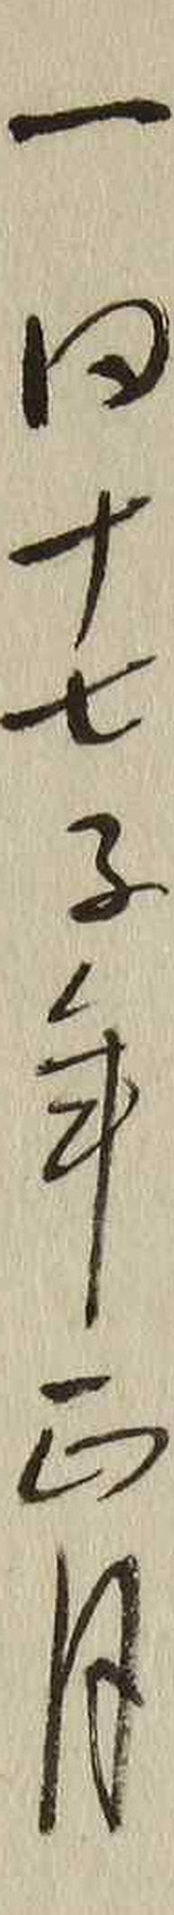一同十七子年正月
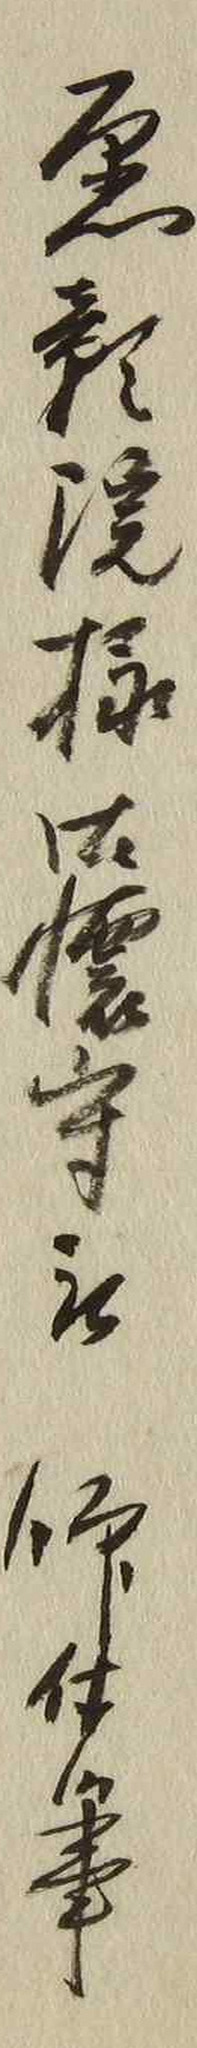愿彰院様御懐守被仰付候事
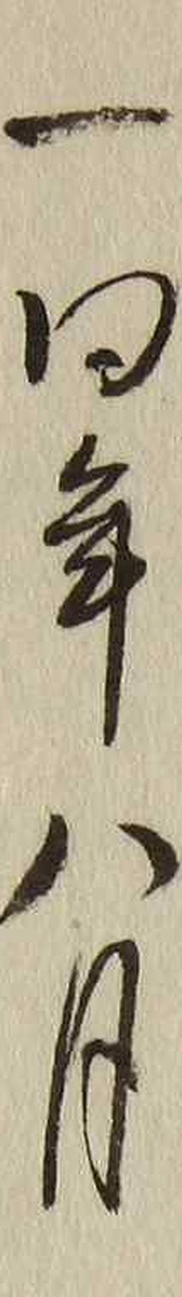一同年八月
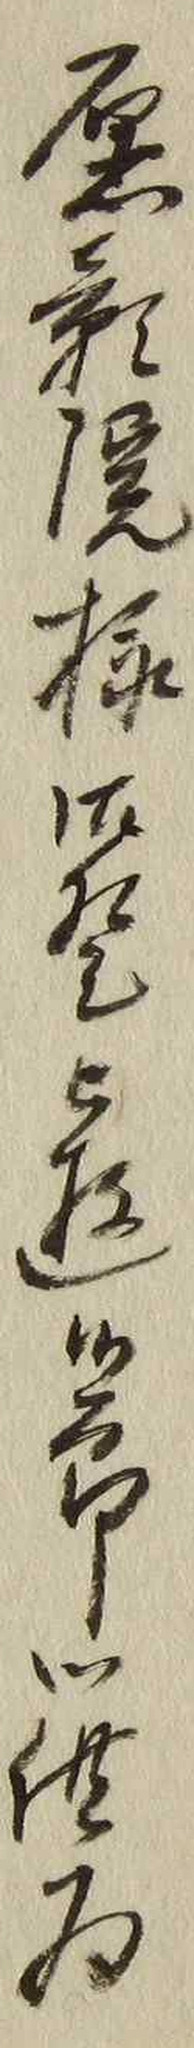愿彰院様御登被遊候節御供為
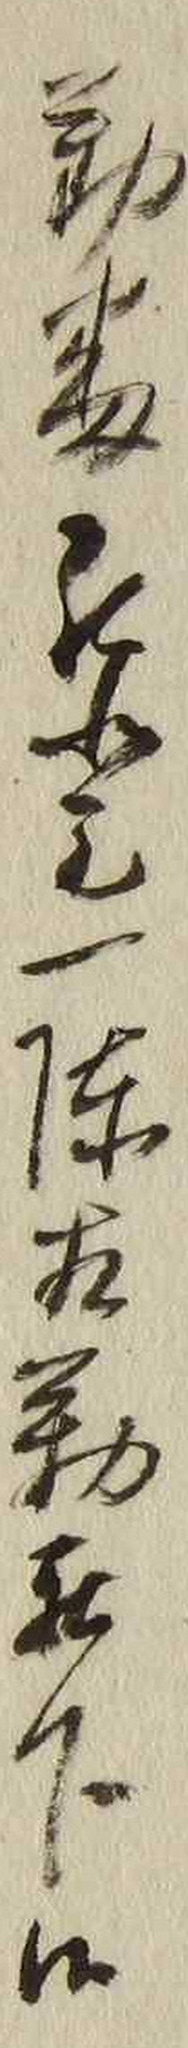勤番罷登一陣相勤罷置下候
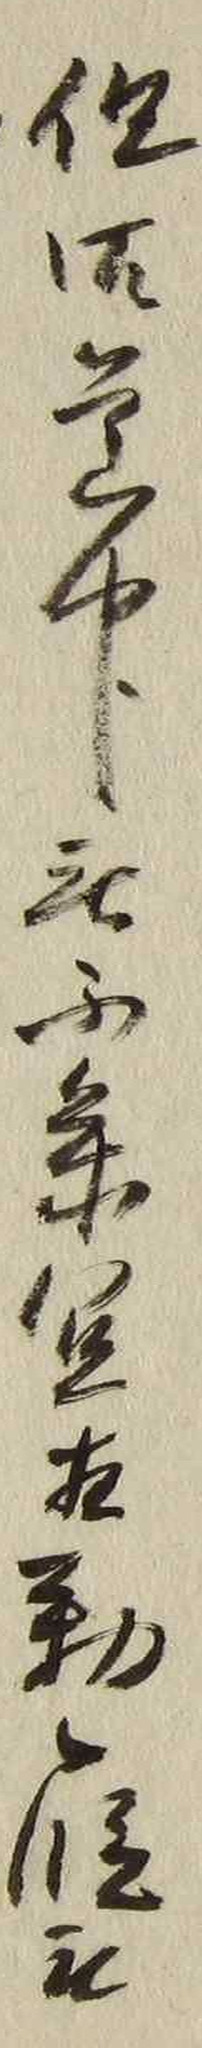但御道中無不参宜相勤候段被
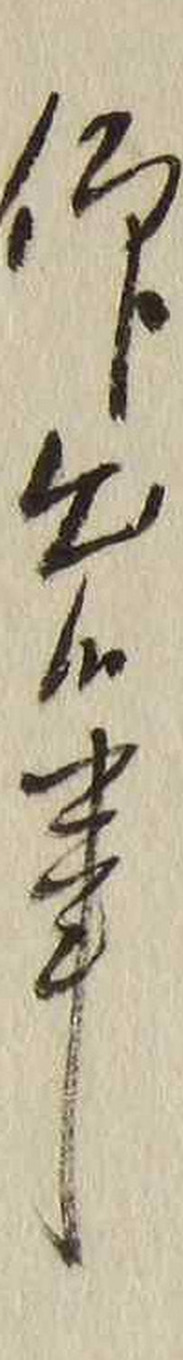仰出候事
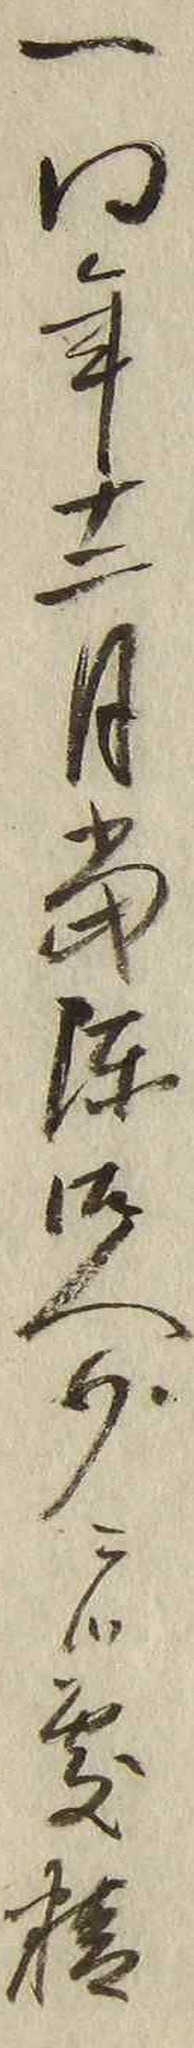一同年十二月当陣御人少ニ候処精

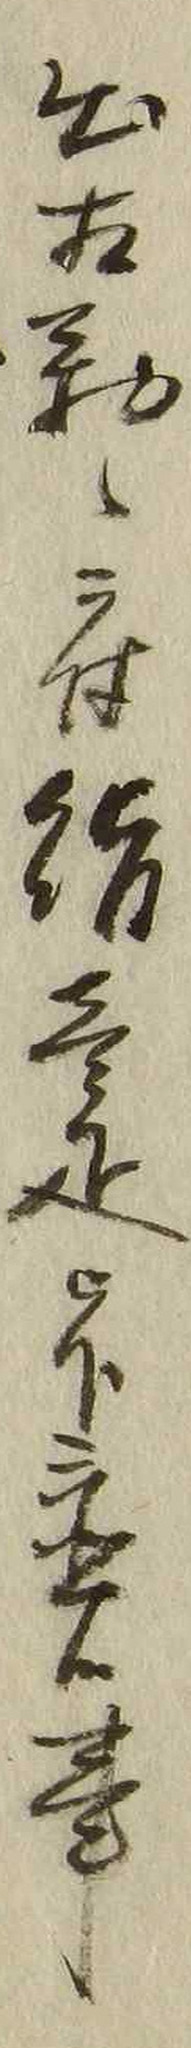出相勤候ニ付絹壱疋被下置候事
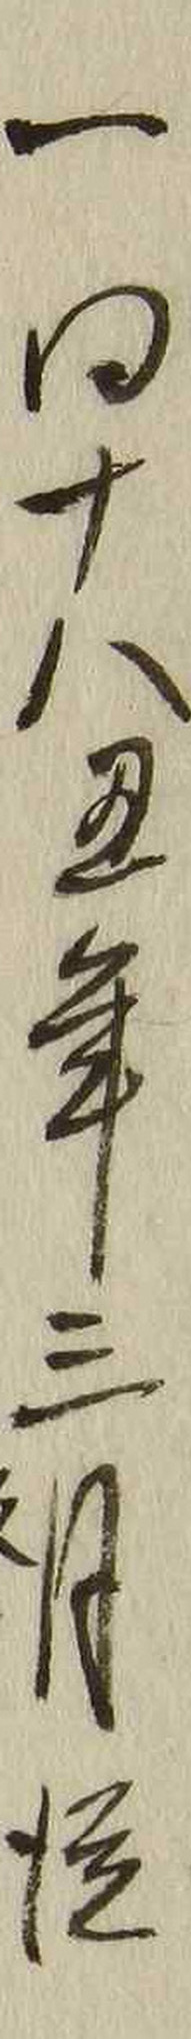一同十八丑年三月従
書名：諸士系譜　巻之359　す之部9
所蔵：会津若松市立会津図書館
